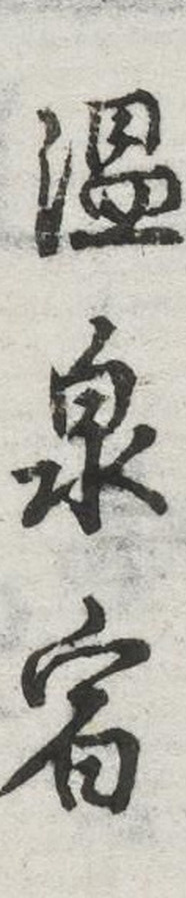温泉宿
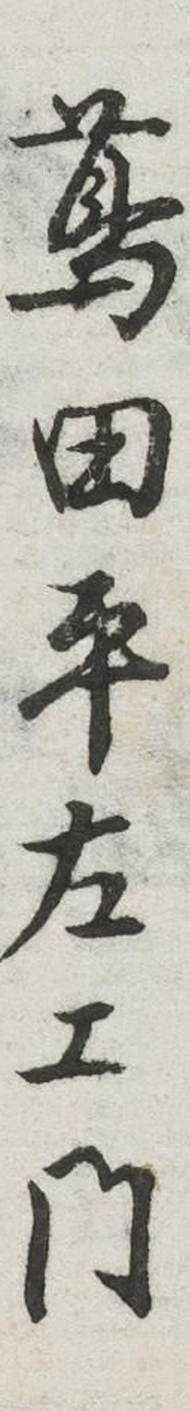蔦田平左エ門
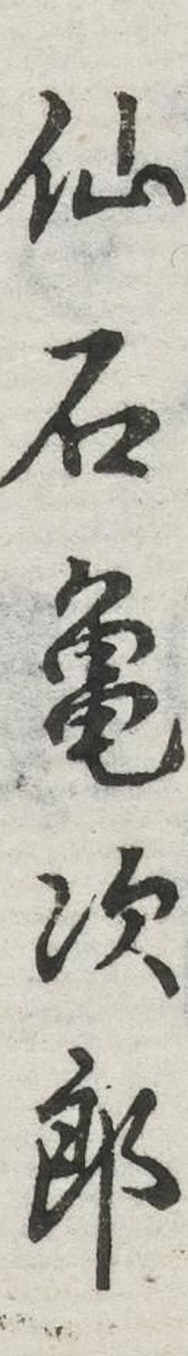千石亀次郎
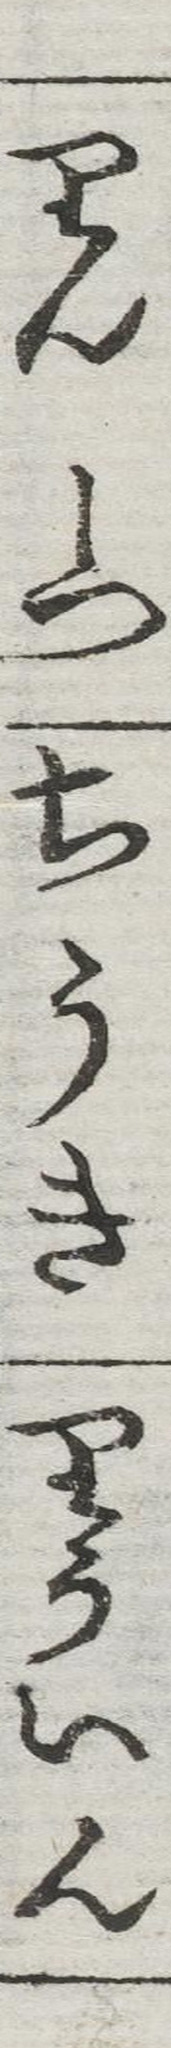りんしつちうきりういん
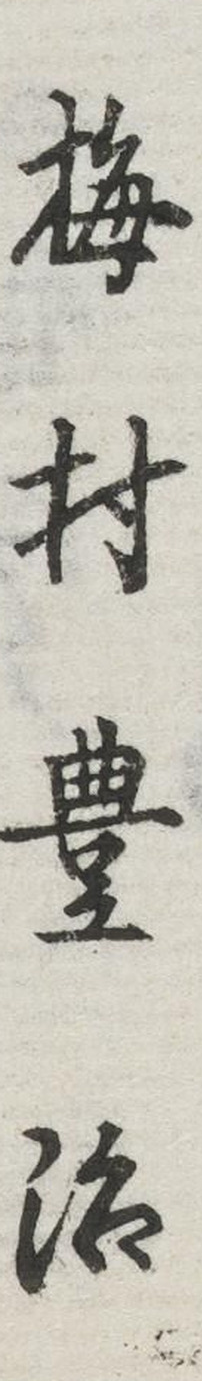梅村豊治
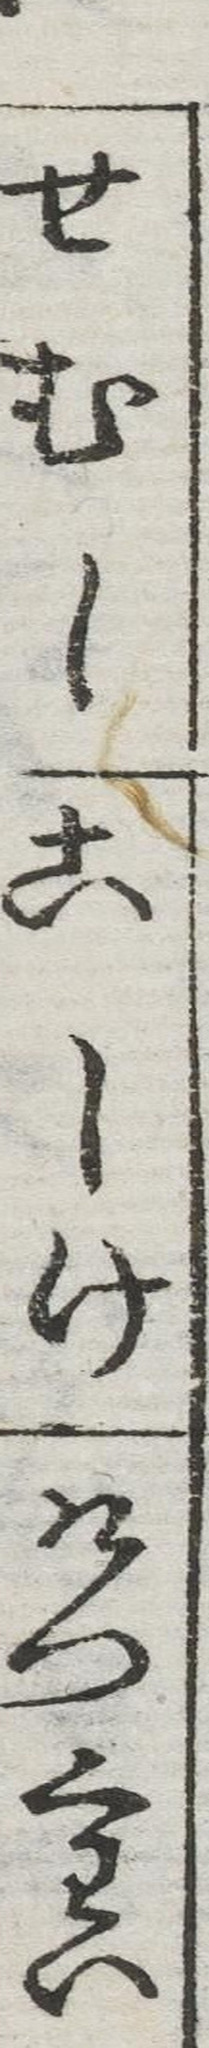せむしこしけけつくわい
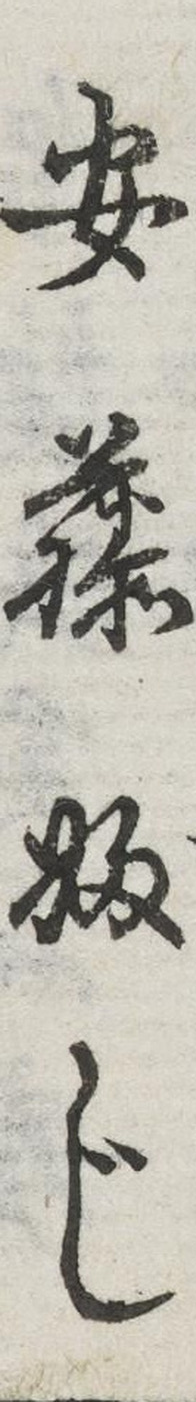安森ふじ
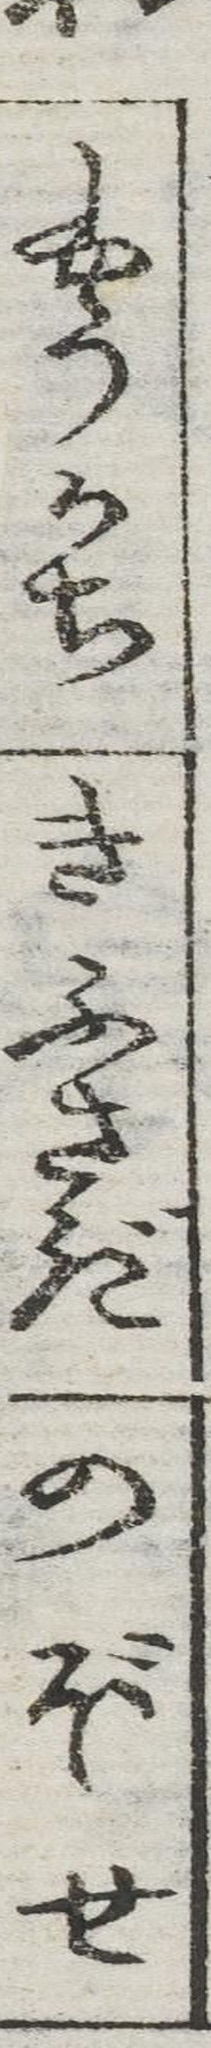しやうかちきふさぎのぼせ
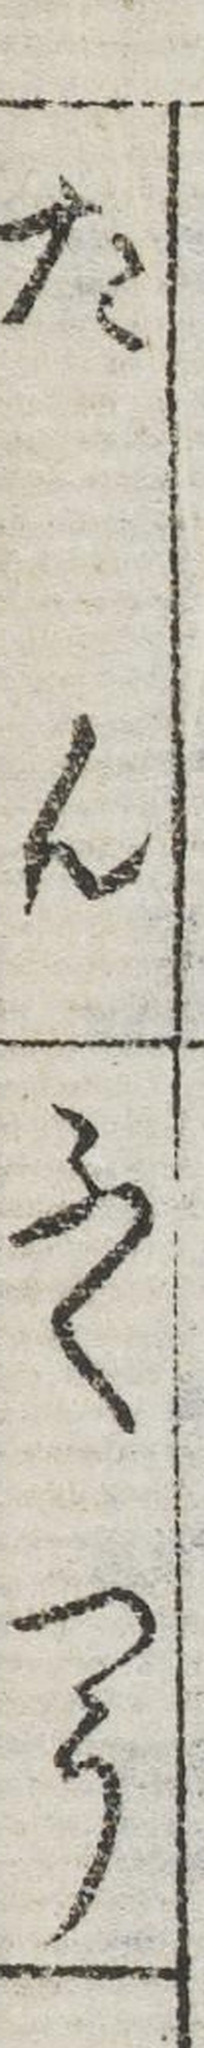たんふくつう

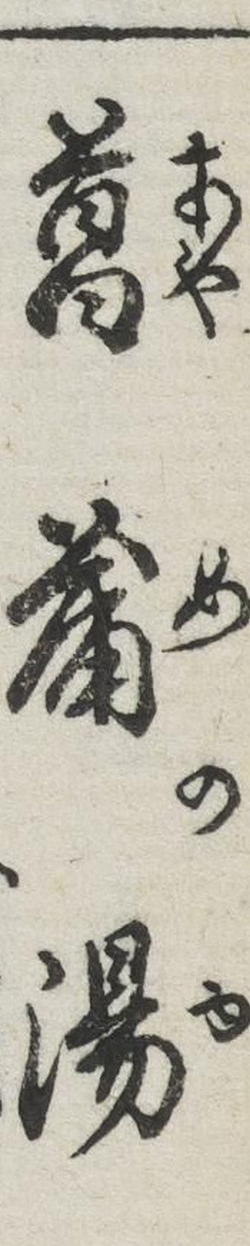菖蒲湯
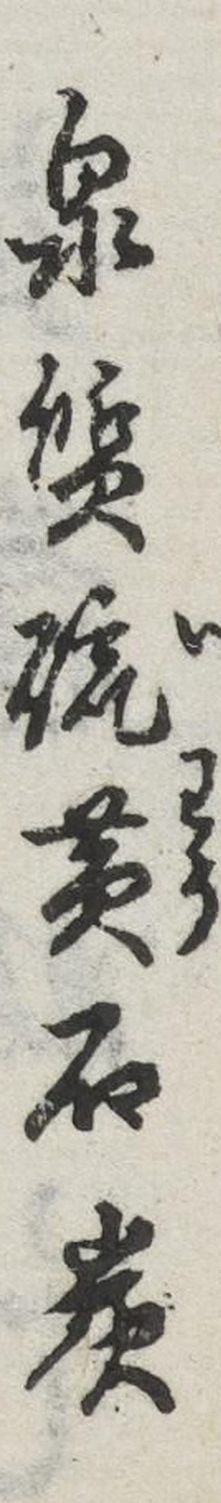泉質硫黄石炭
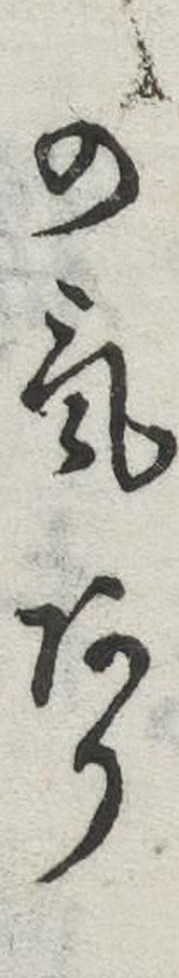の気あり
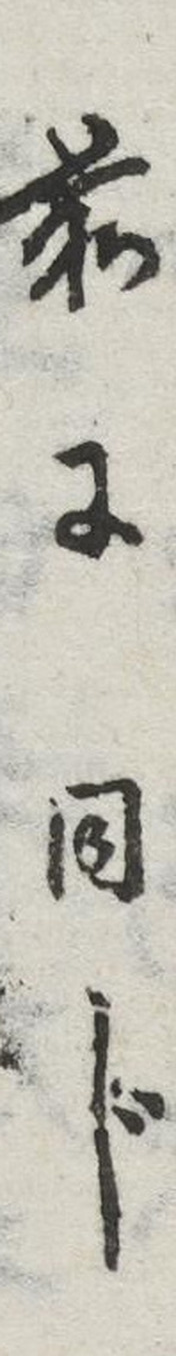前に同じ
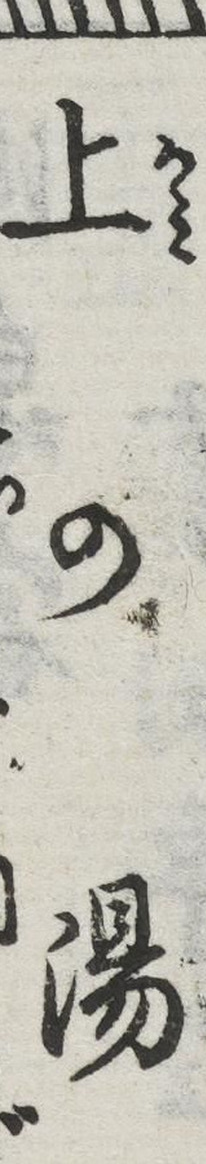上の湯
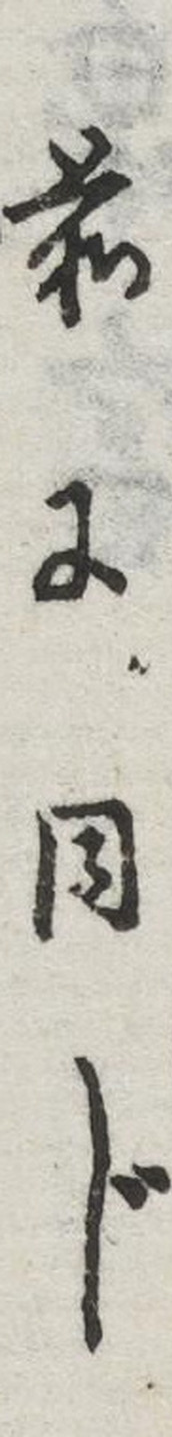前に同じ
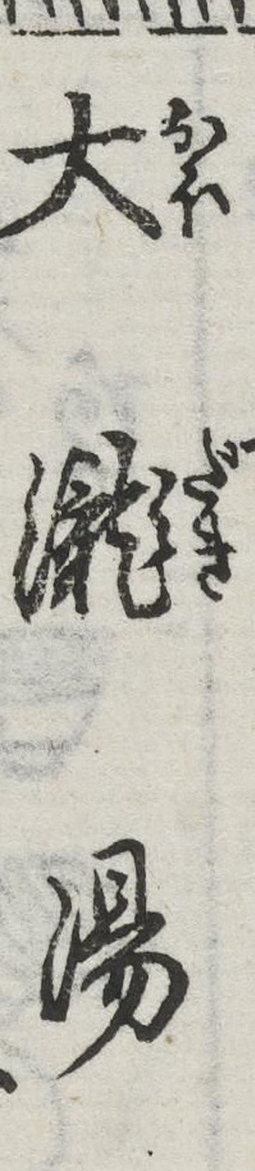大瀧湯
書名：諸國温泉遊覽記　全
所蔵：東京大学地震研究所図書室 Earthquake Research Institute Library, The University of Tokyo, JAPAN
